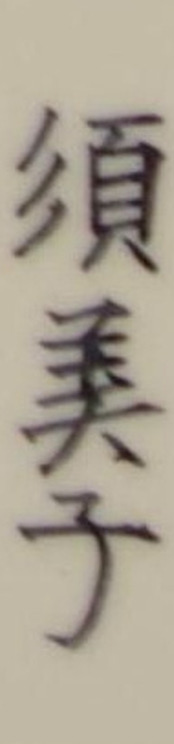須美子
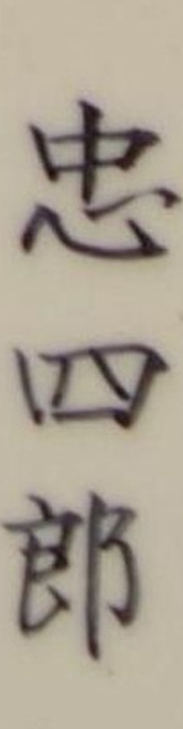忠四郎
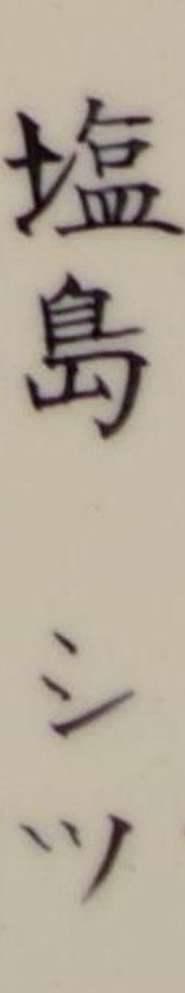塩島シツ
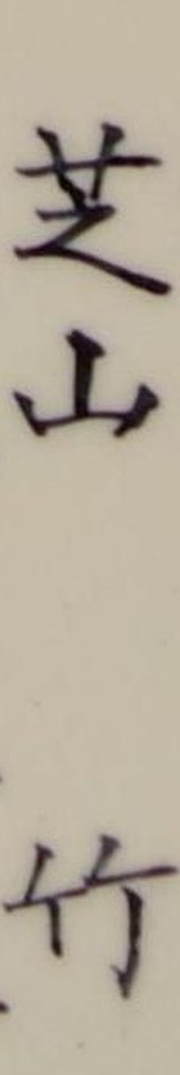芝山竹
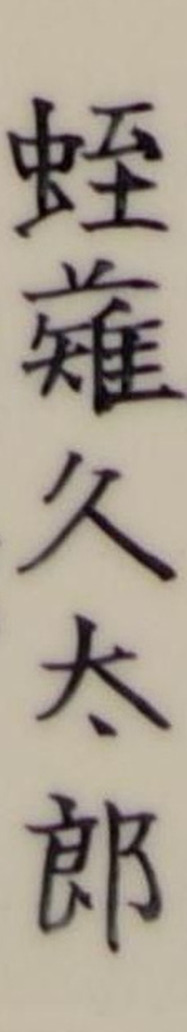蛭薙久太郎
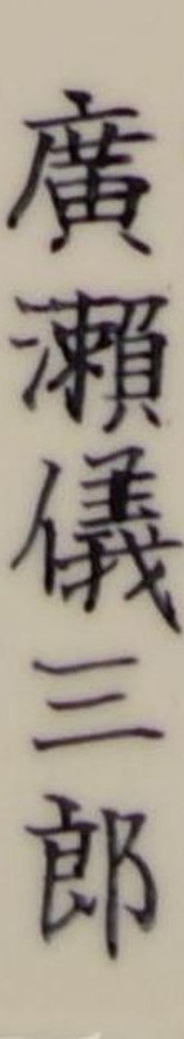廣瀬儀三郎
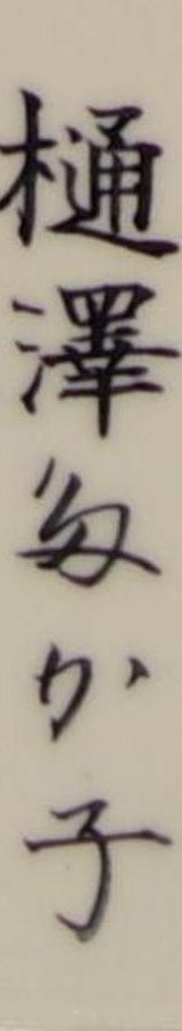樋澤たか子
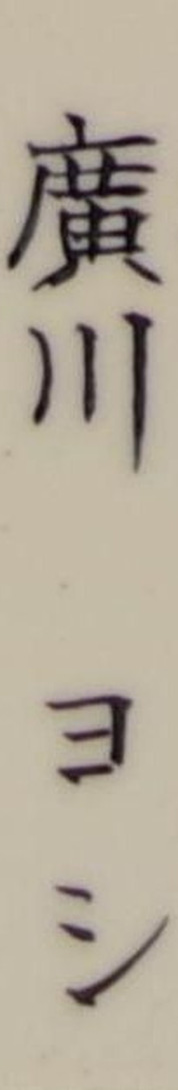廣川ヨシ
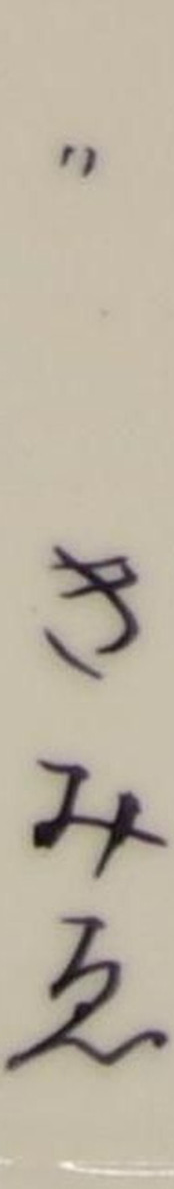きみゑ
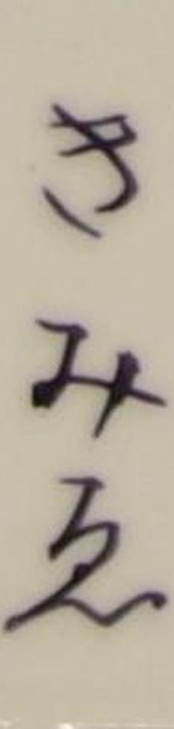きみゑ
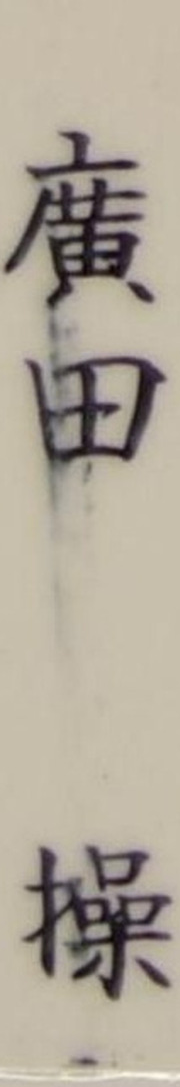廣田操
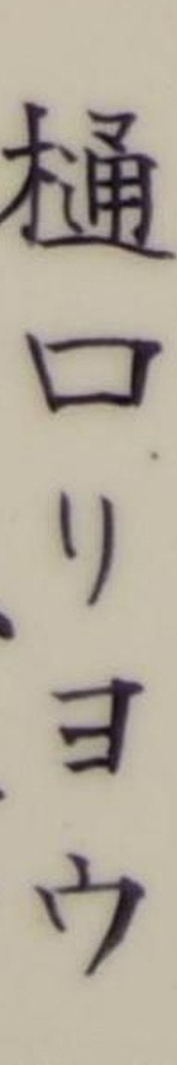樋口リヨウ
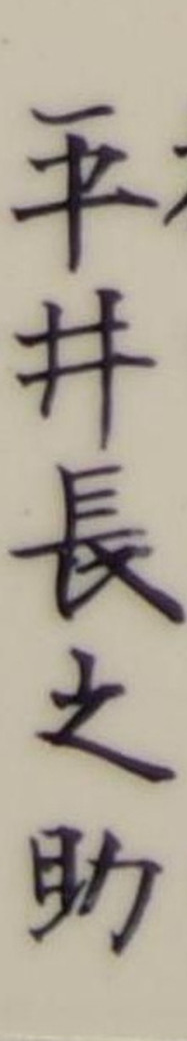平井長之助

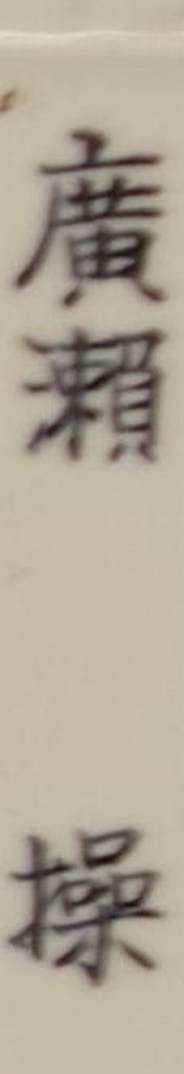廣瀬操
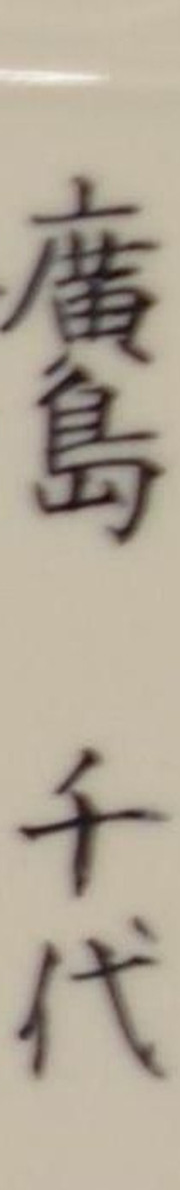廣島千代
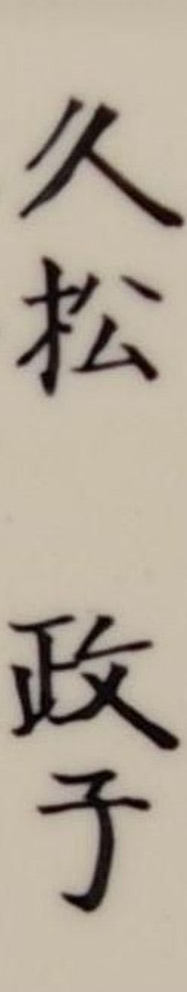久松政子
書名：M~S
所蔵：高野山金剛峯寺
